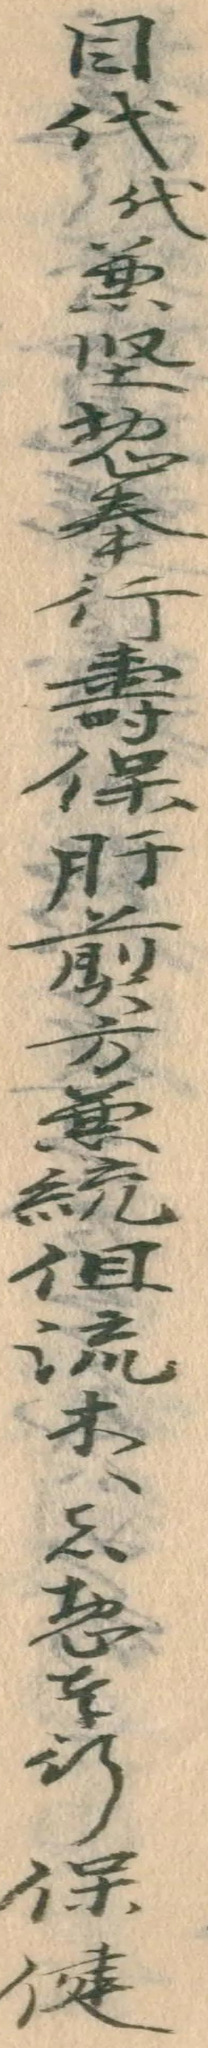目代代兼堅惣奉行寿保肝煎方兼統但流木ヘは惣奉行保健
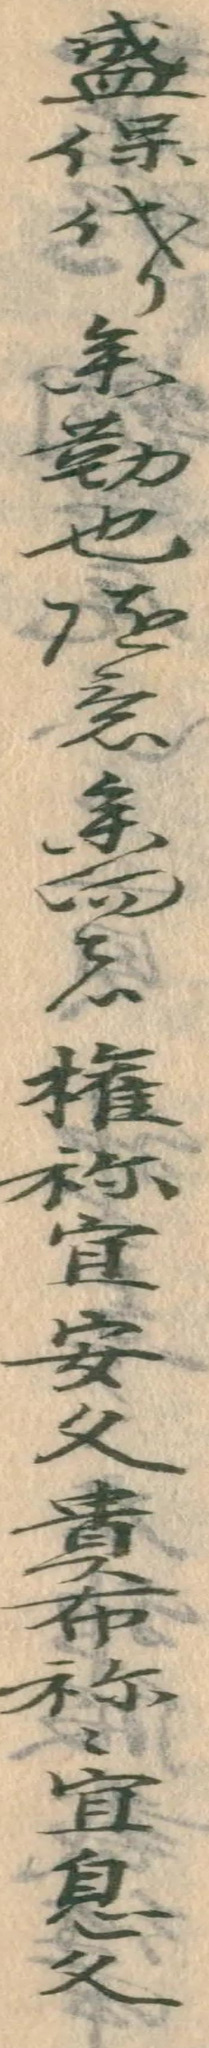盛保代リ参勤也随意参向は権祢宜安久貴命祢々宜息久
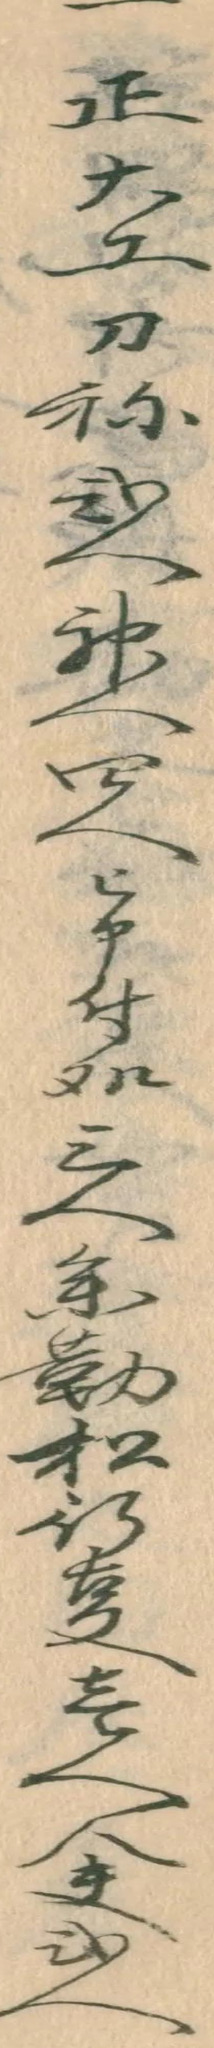一正大工刀祢弐人神人四人被申付処三人参勤松行事へ壱人人夫弐人
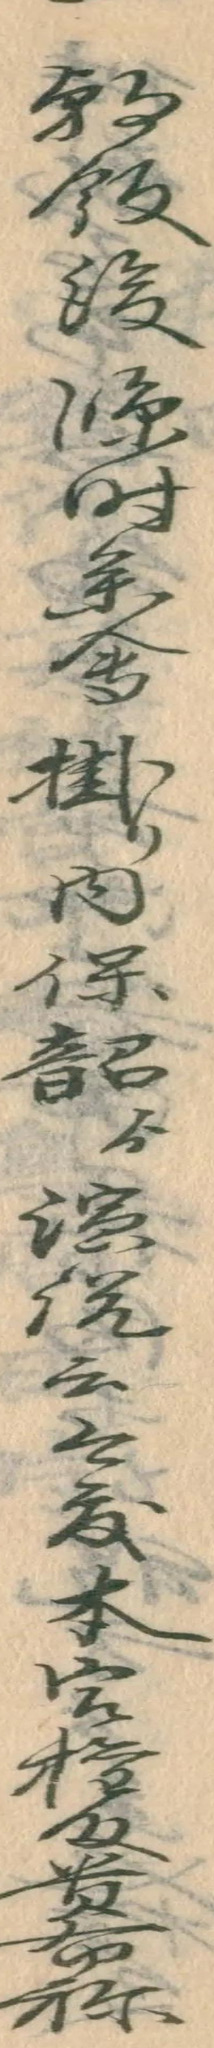一朝飯後臨時参会掛り内保韶ゟ演説云今度本宮権殿貴布祢
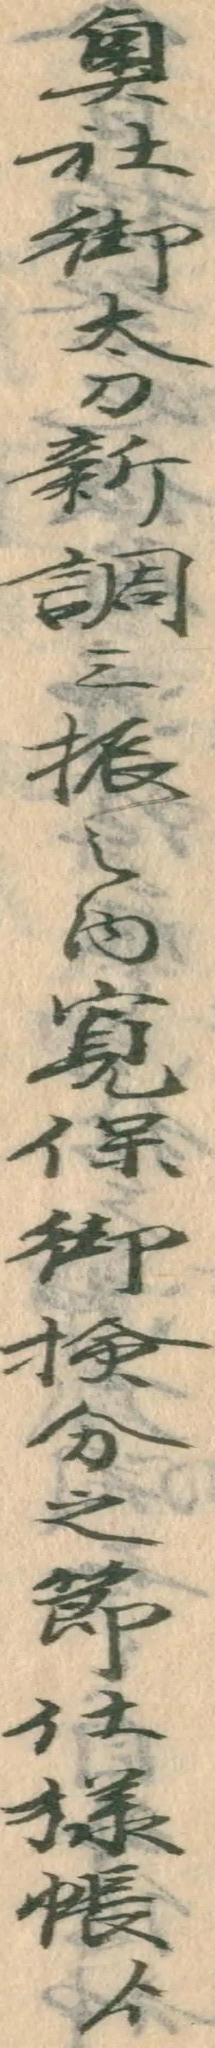奥社御太刀新調三振之内寛保御検分之節仕様帳ゟ
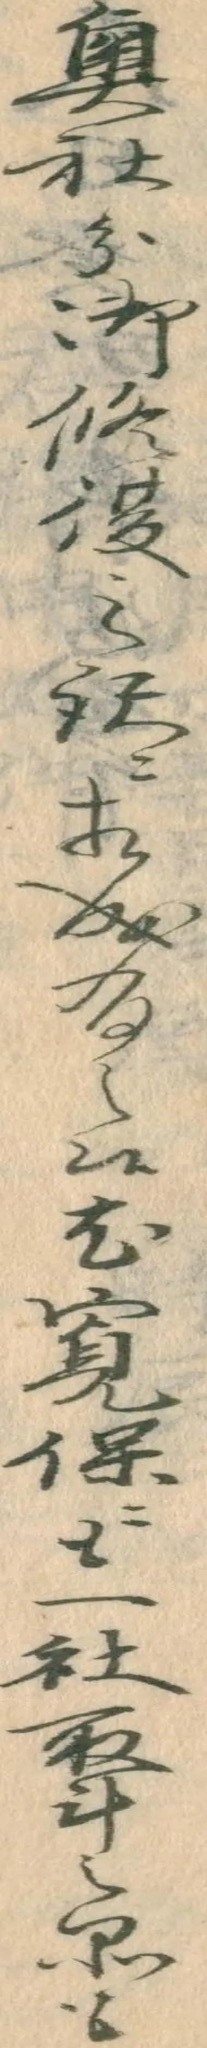奥社分御修復之訳ニ相成有之候尤寛保ニも一社取計之品も
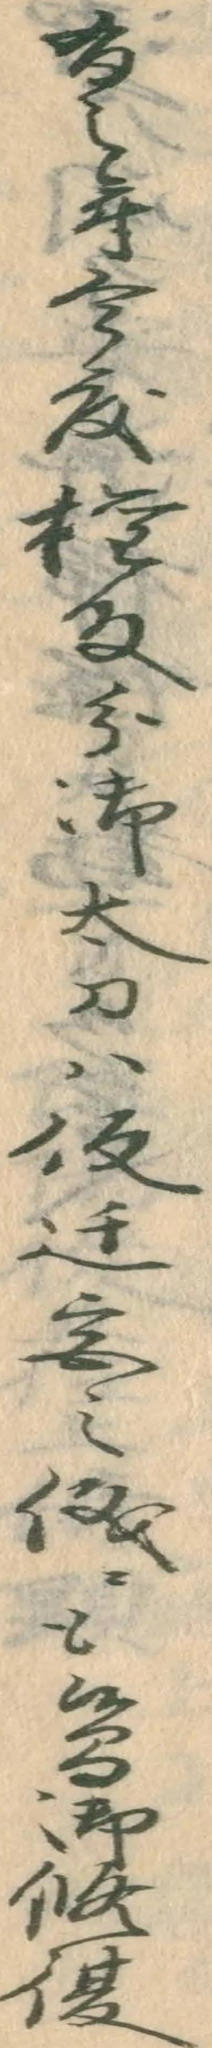有之ニ付今度権殿分御太刀ハ仮迁宮之儀ニも候間御修復
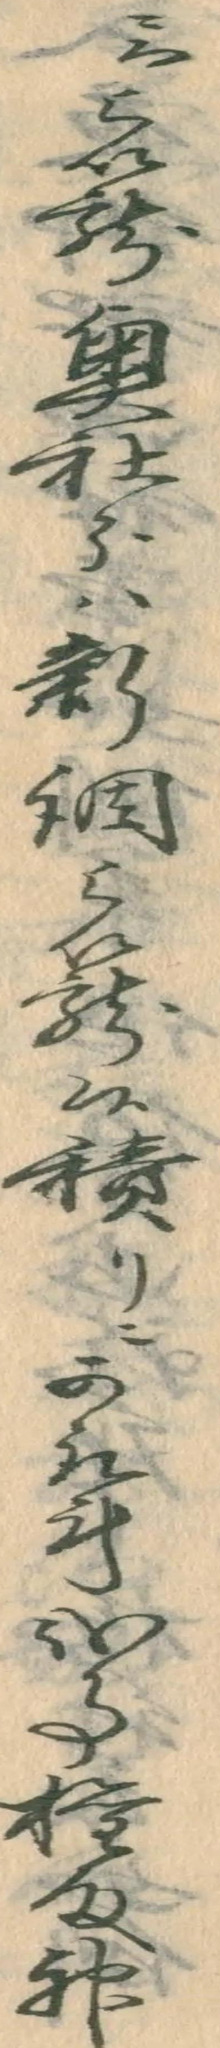ニ而被籠奥社分ハ新調被籠候積りニ可取計哉事権殿神
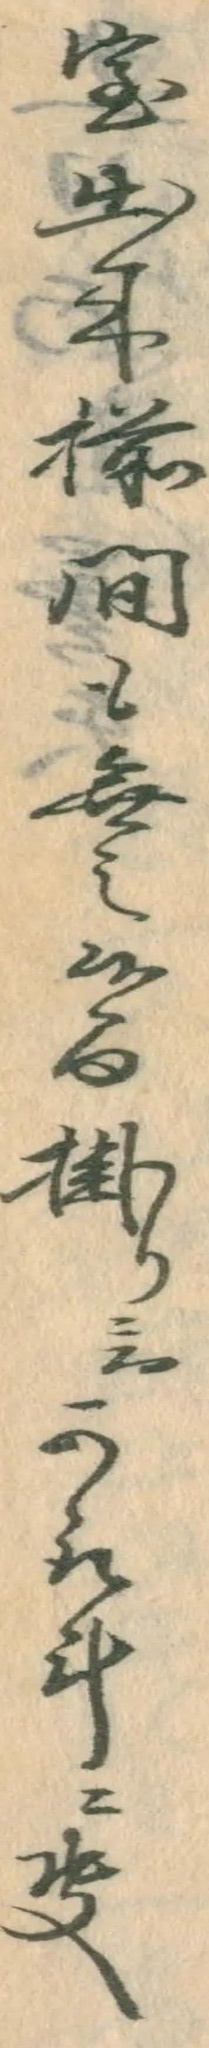宝出来揃間も無之候間掛りニ而可取計ニ決

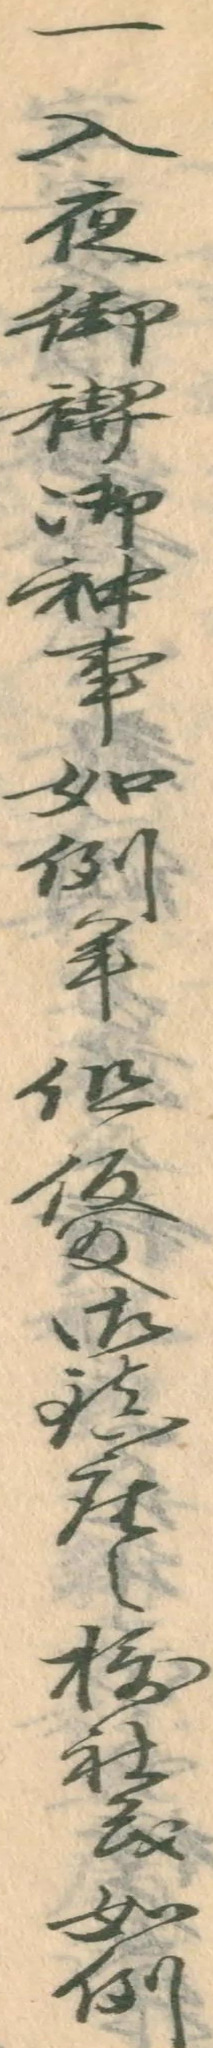一入夜御禊御神事如例年但仮殿御鎮座之摂社茂如例
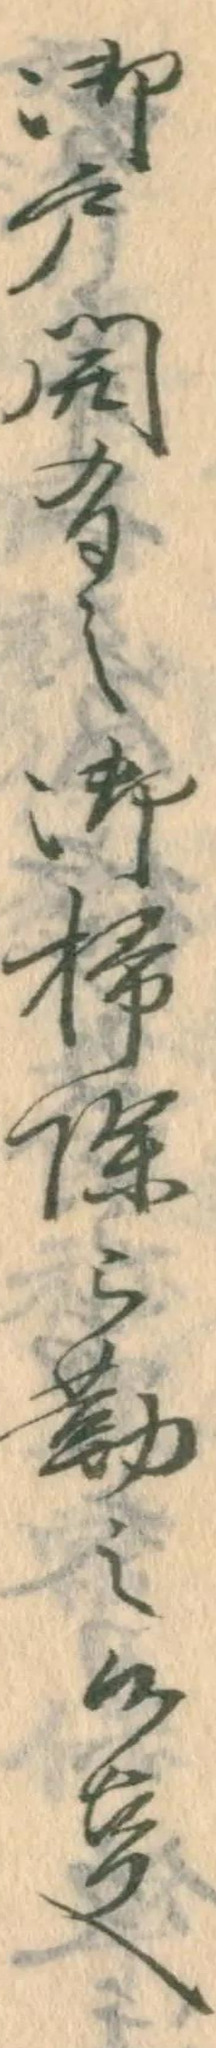御戸開有之御掃除被勤之候事
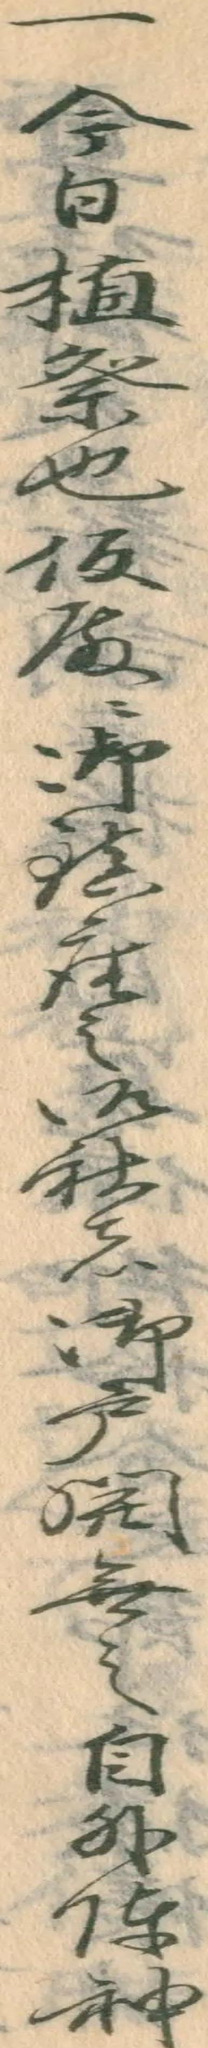一今日植祭也仮殿ニ御鎮座之御社は御戸開無之自外陣神
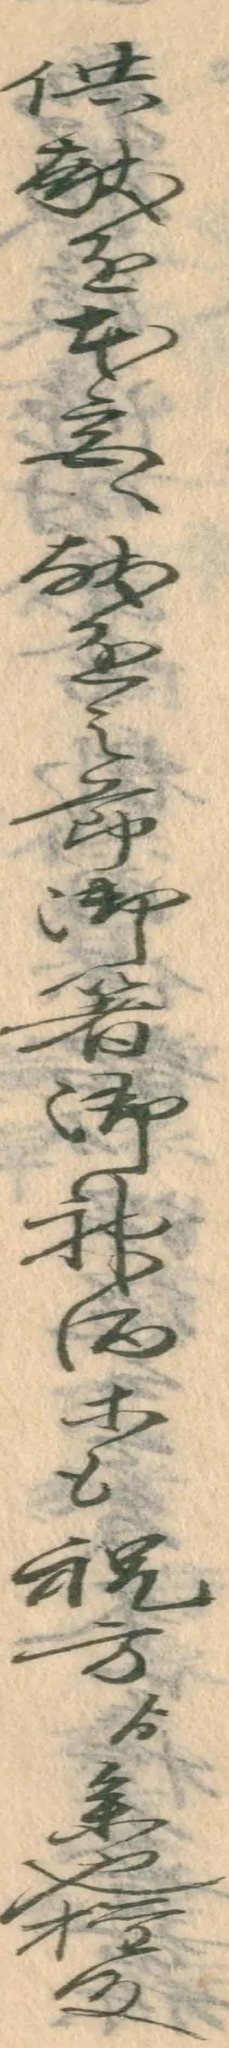供献進本宮へ献進之節御箸御神酒等も祝方ゟ参也権殿
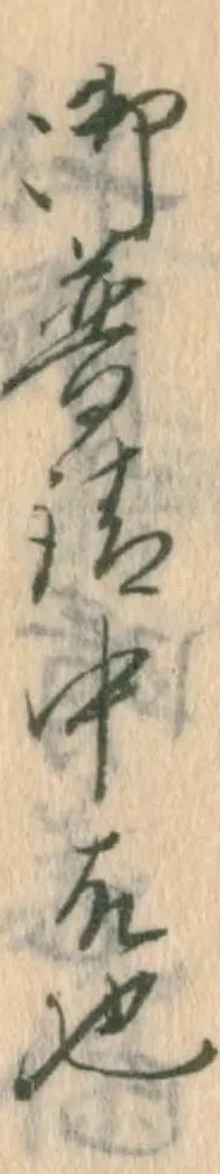御普請中故也
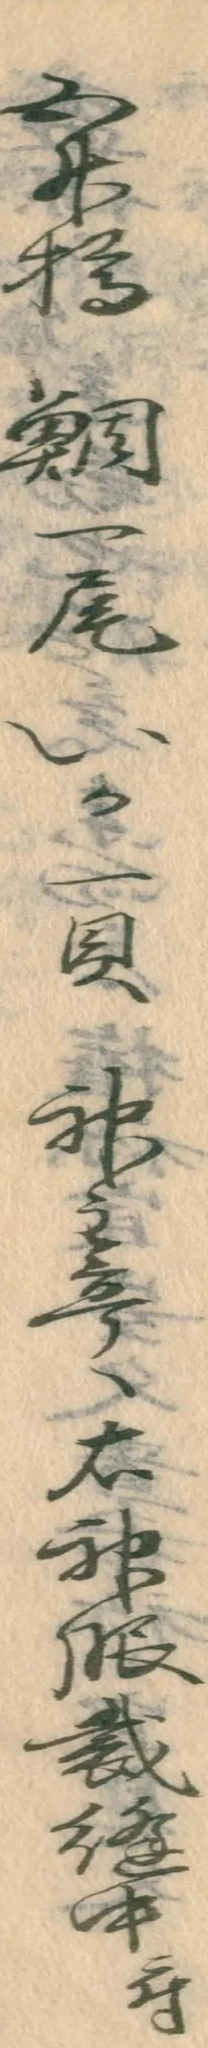一五升樽鯛一尾いか一貝神主亭へ右神服裁縫中ニ付
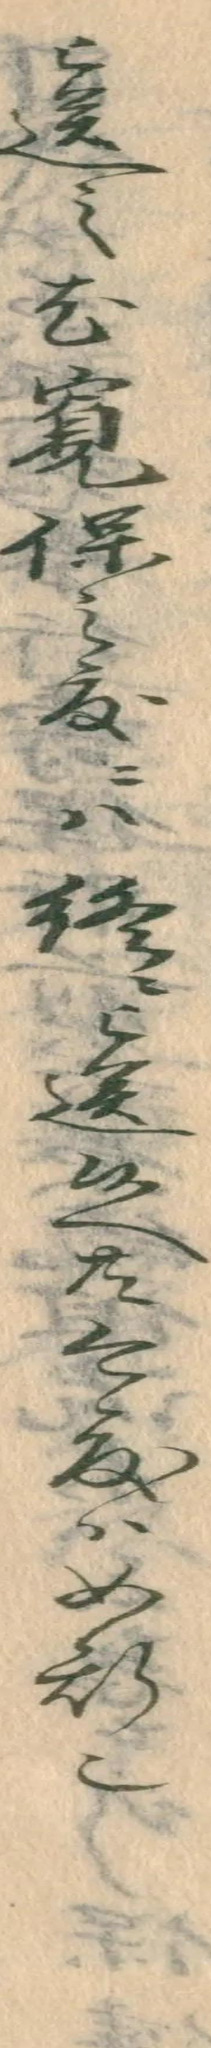被送之尤寛保之度ニハ終ニ被送候へ共今度ハ如斯也
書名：賀茂社記録. 第17冊
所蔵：国立国会図書館 National Diet Library, JAPAN
